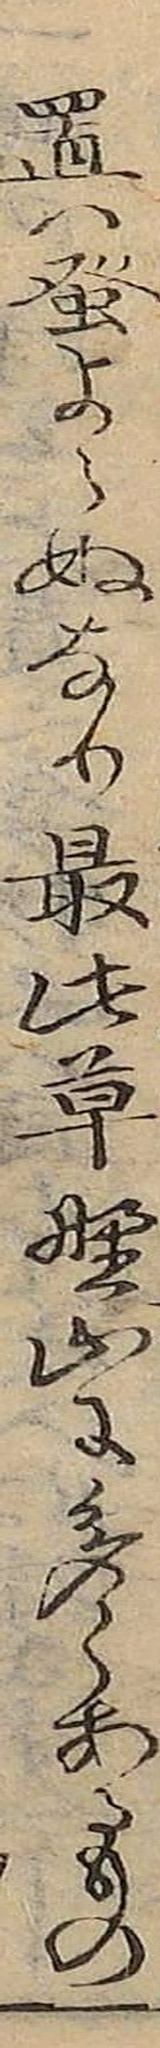置は蚤よらぬなり最此草野山に多くあるもの
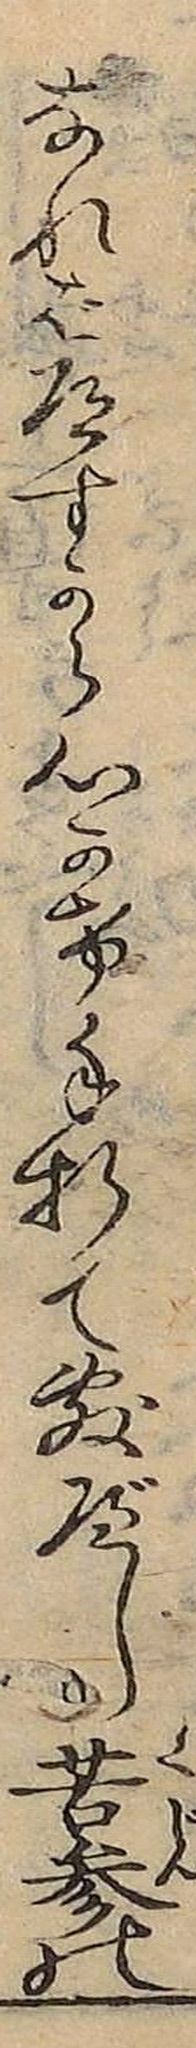なれば道すから心かけ手折て敷べし苦参の
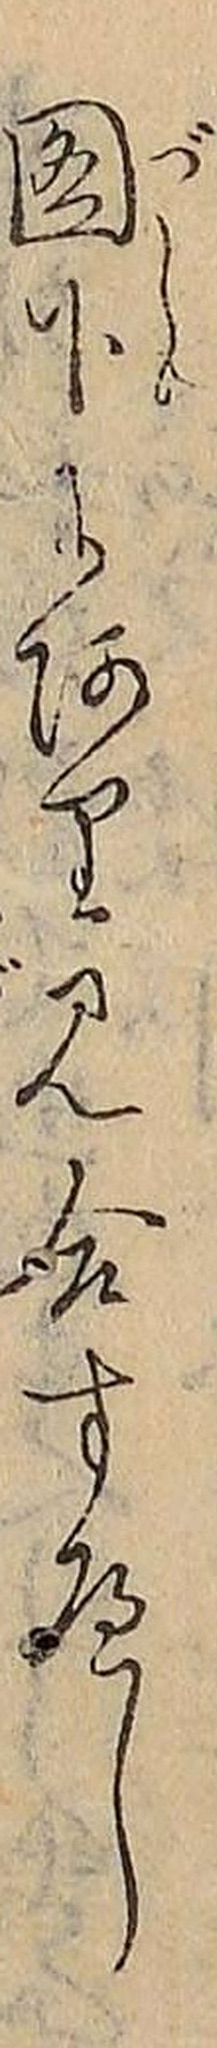図下にあり見合すへし
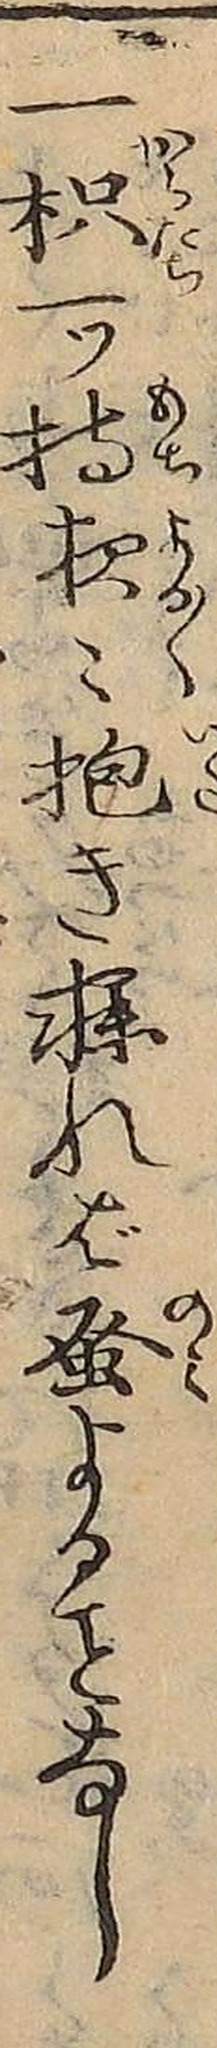一枳一ツ持夜々抱き寐れば蚤よることなし
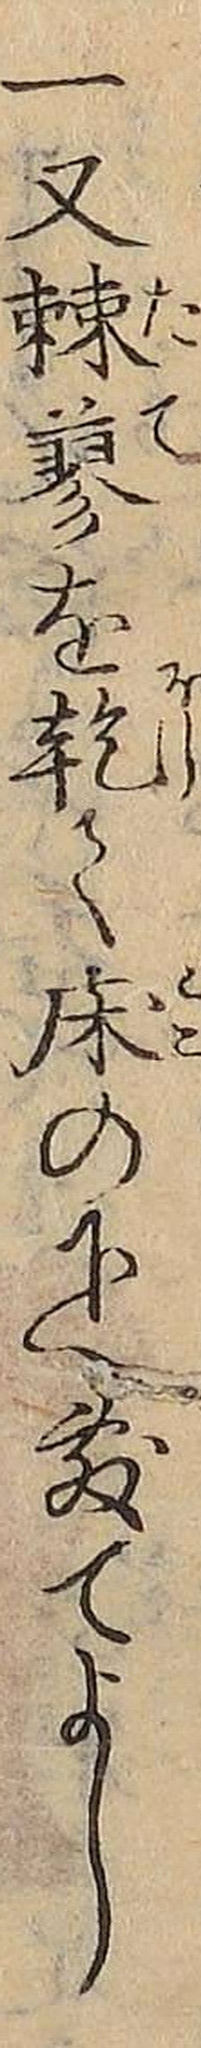一又棘蓼を乾て床の下へ敷てよし
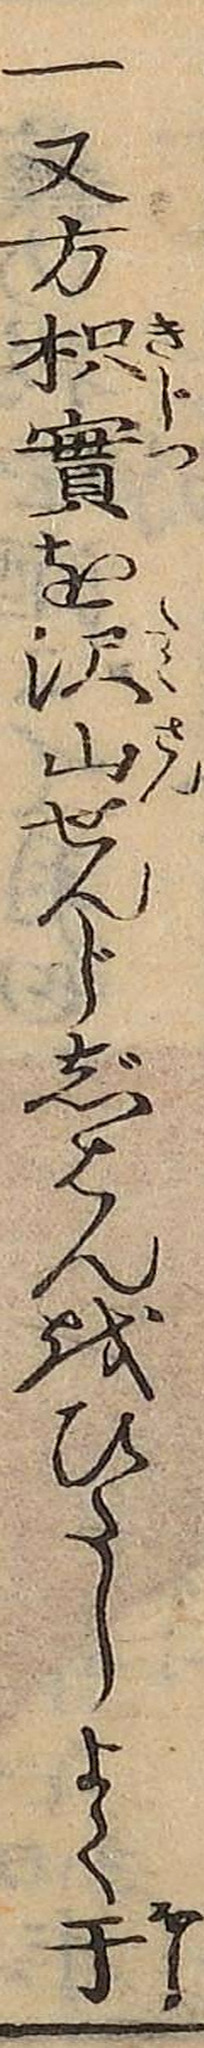一又方枳実を沢山せんじじはんをひたしよく干
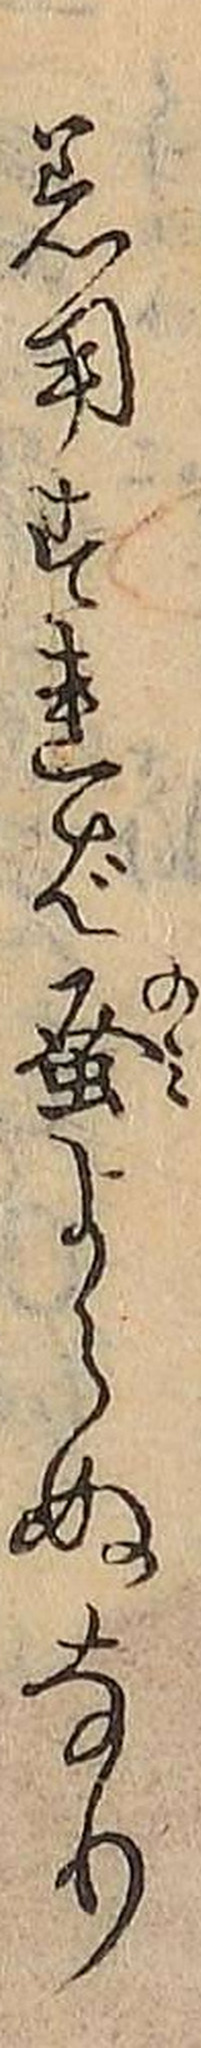着用すれば蚤よらぬなり
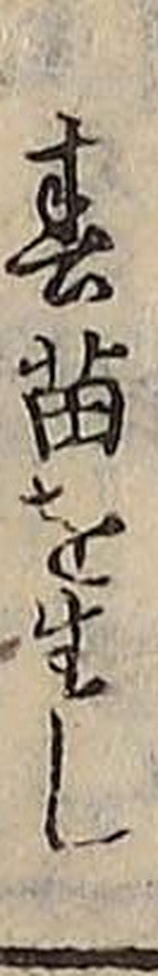春苗を生し
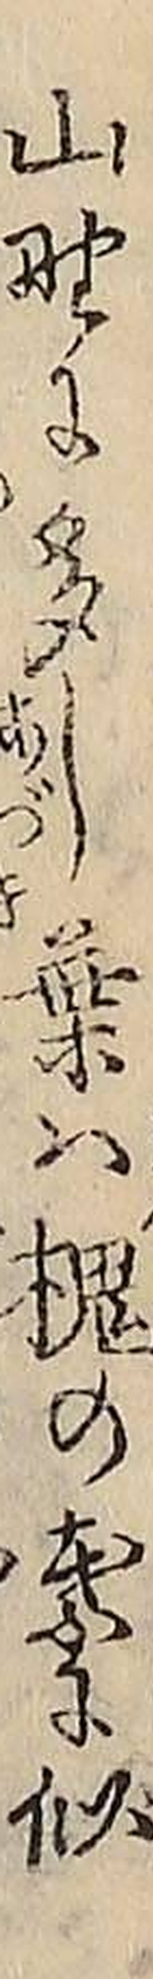山野に多し葉は槐の葉に似
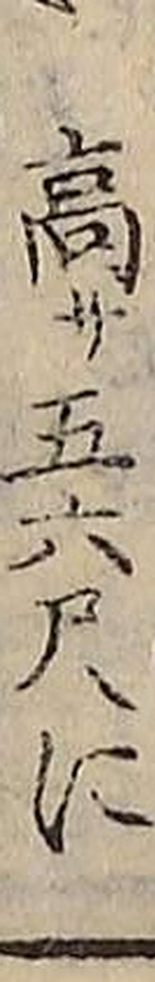高五六尺に
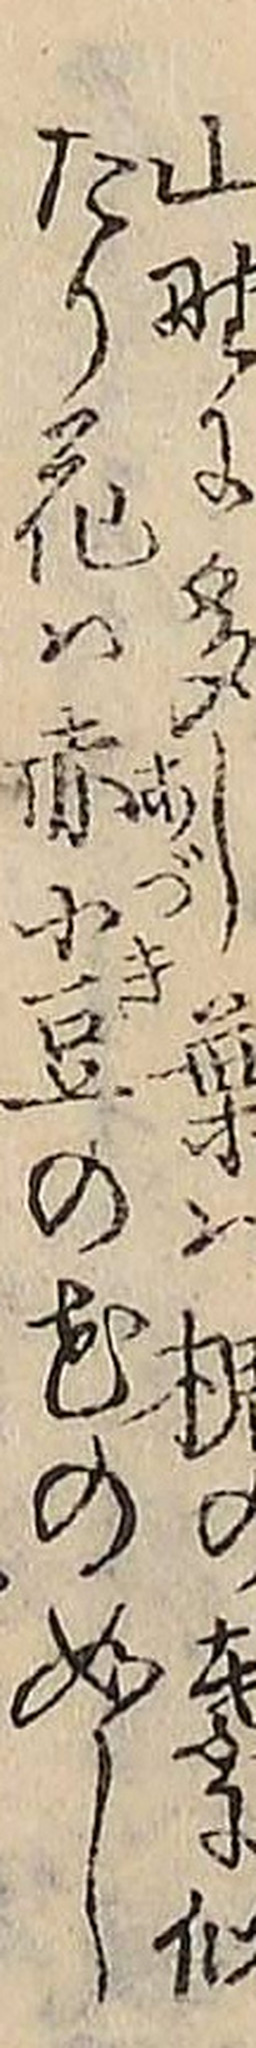たり花は赤小豆の花のめし
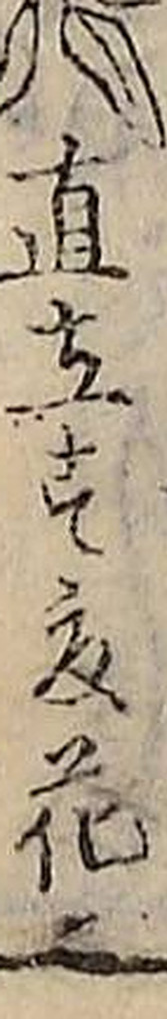直立す夏花
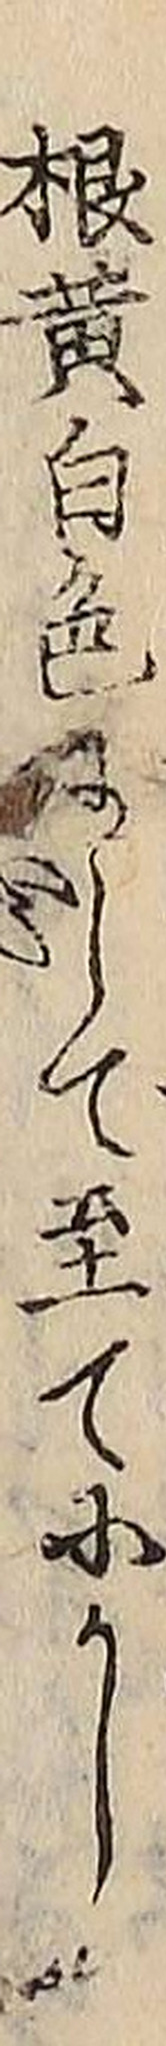根黄白色にして至てにかし
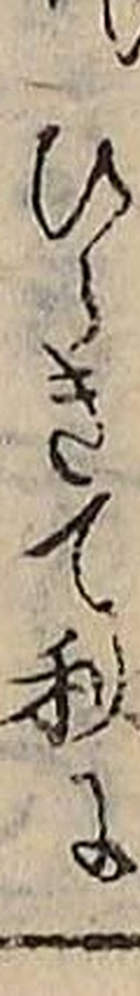ひらきて秋に
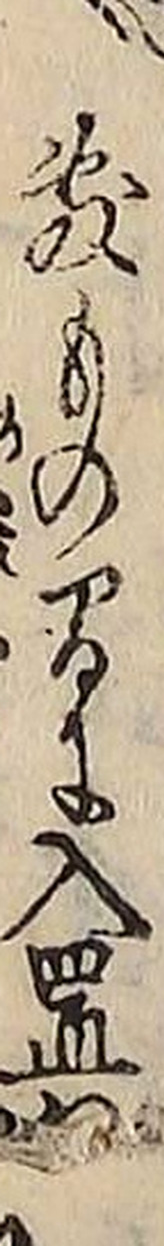敷もの間に入四置は
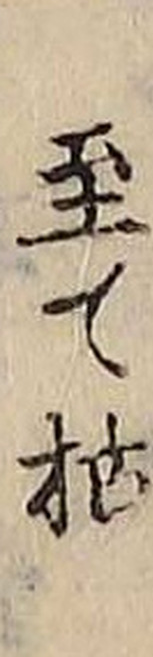至て枯
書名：旅行用心集
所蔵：神戸大学附属図書館 国文学研究資料館
